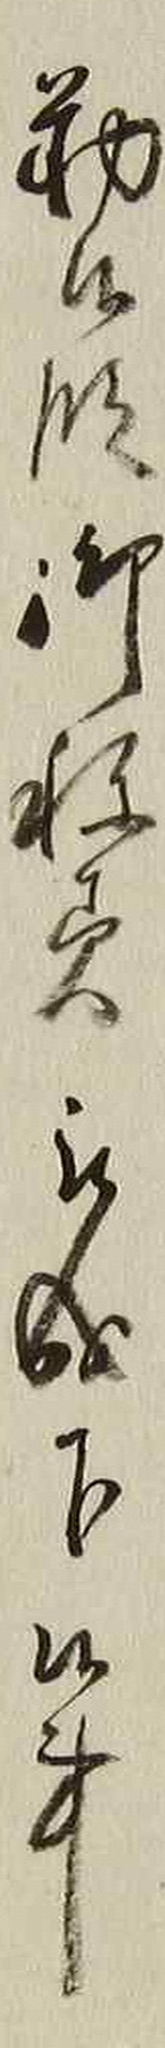勤候段御称美被成下候事
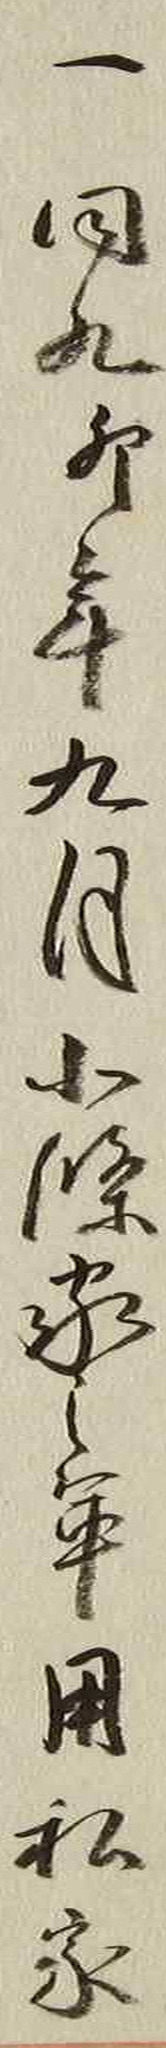一同九卯年九月北条家之軍用私家
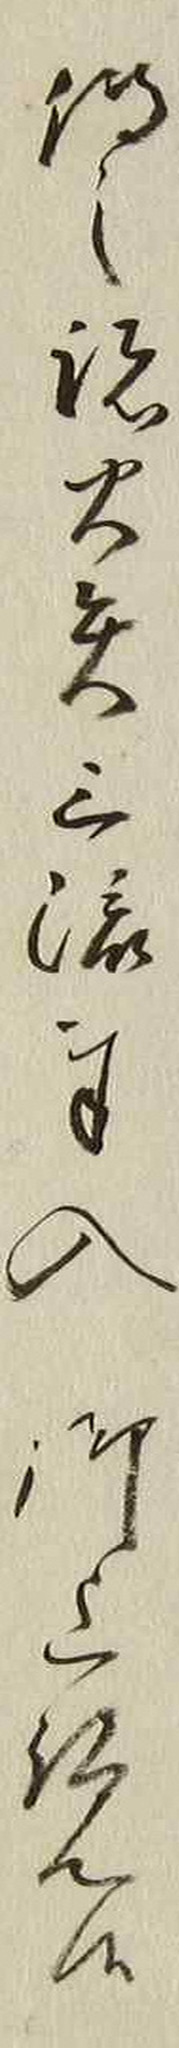伝之諸火矢三流奉入御上覧候
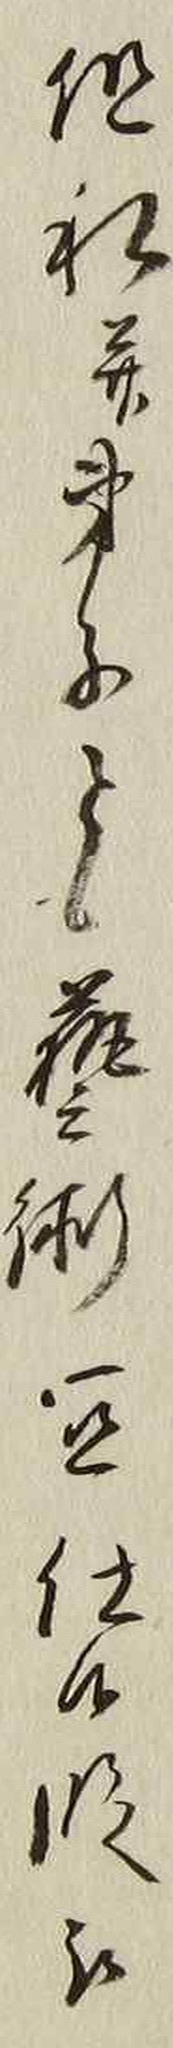但私并弟子とも芸術宜仕候段被
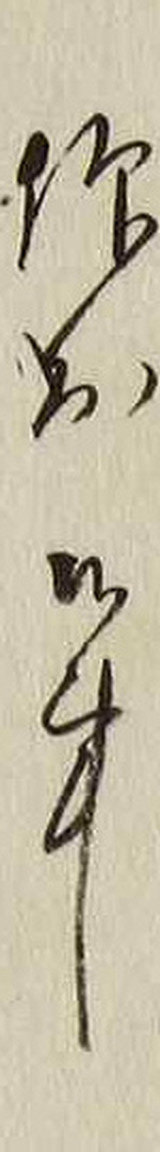仰出候事
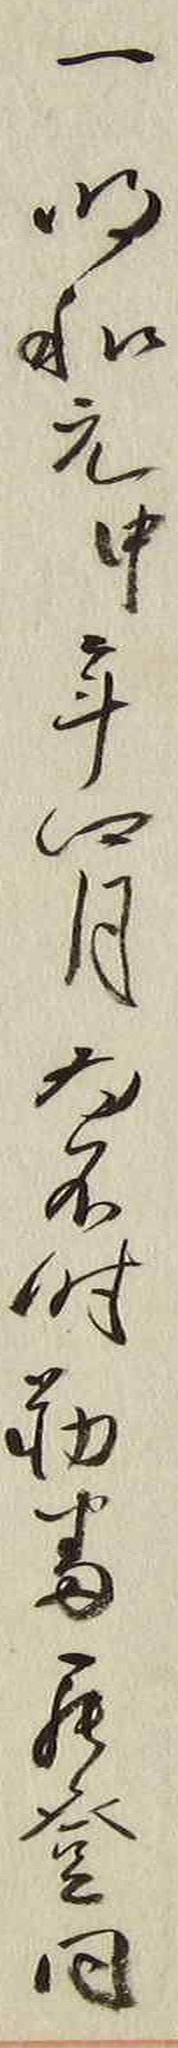一明和元申年四月為不時勤番罷登同
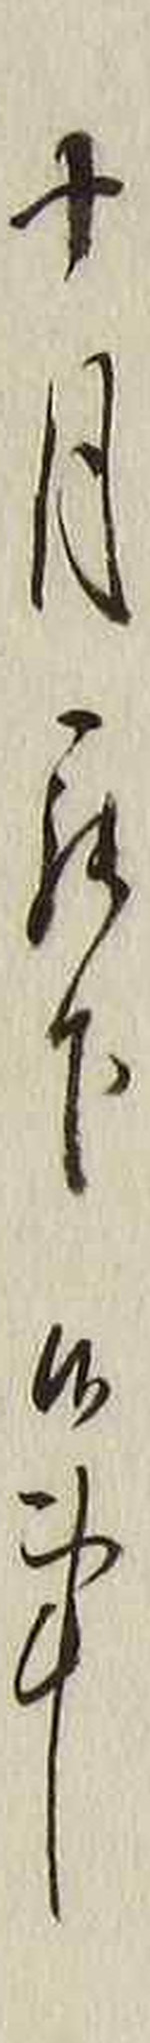十月罷下候事
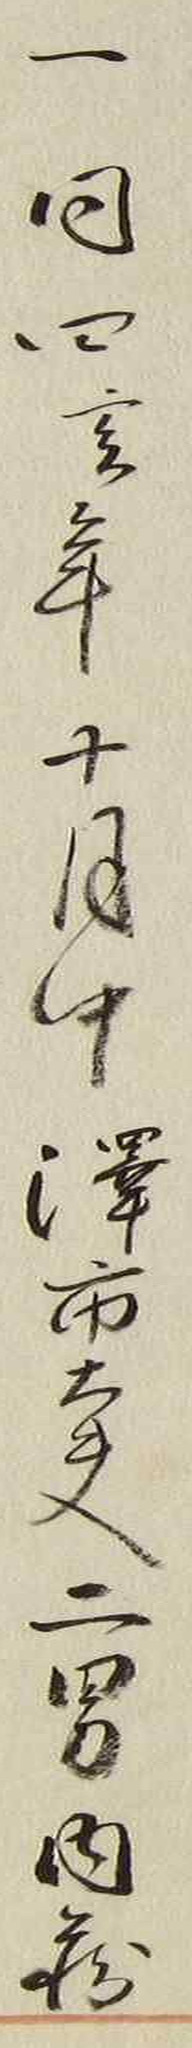一同四亥年十月中沢市大夫二男内蔵
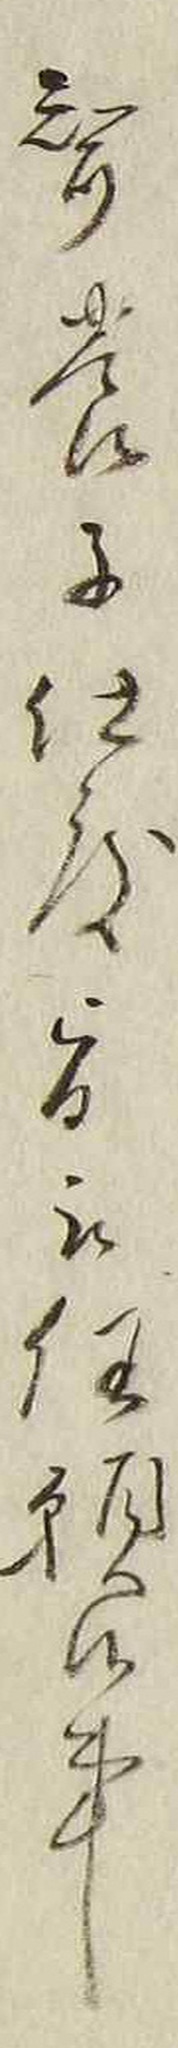婿養子仕度旨被任願候事
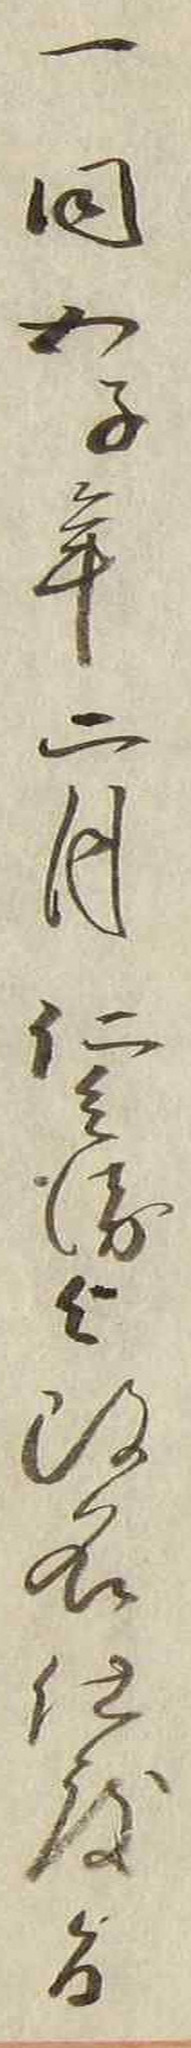一同五子年二月仁兵衛与改名仕度旨

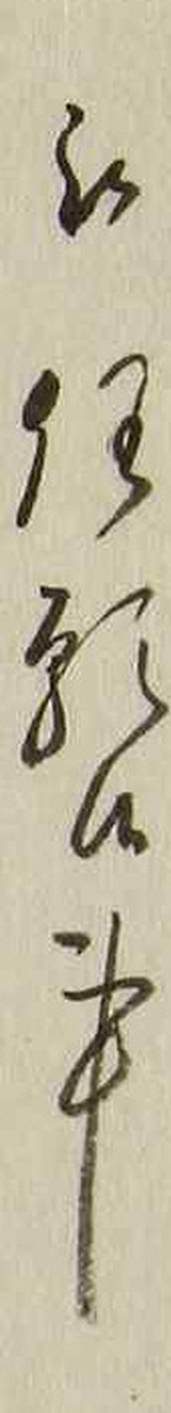被任願候事
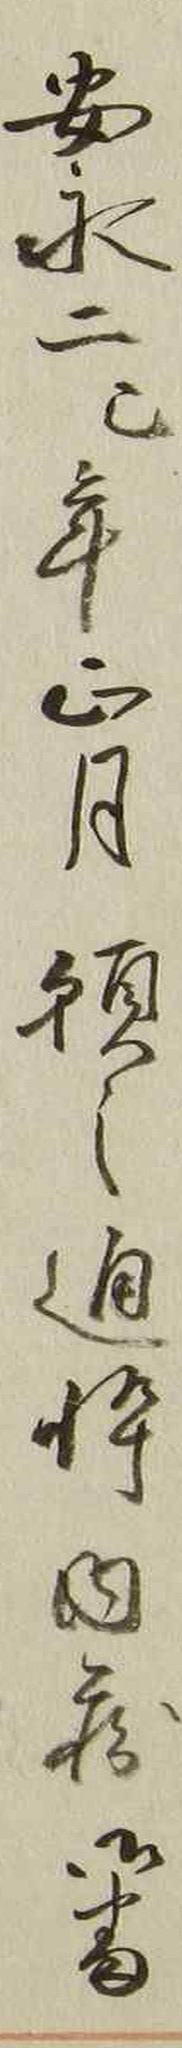安水二巳年正月願之通忰内蔵御番
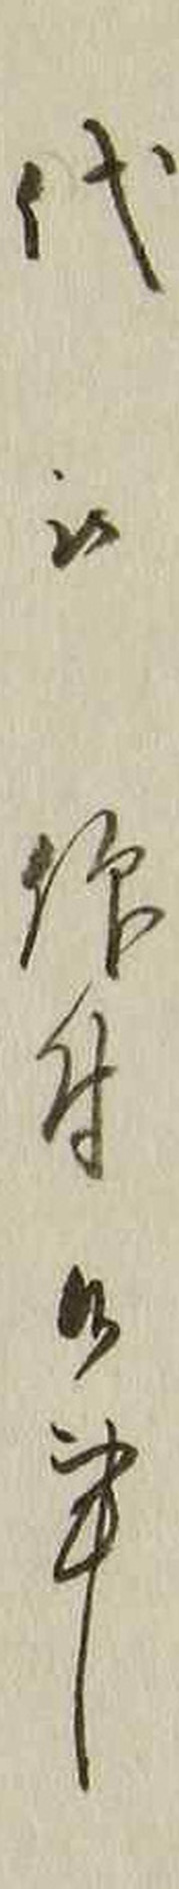代被仰付候事
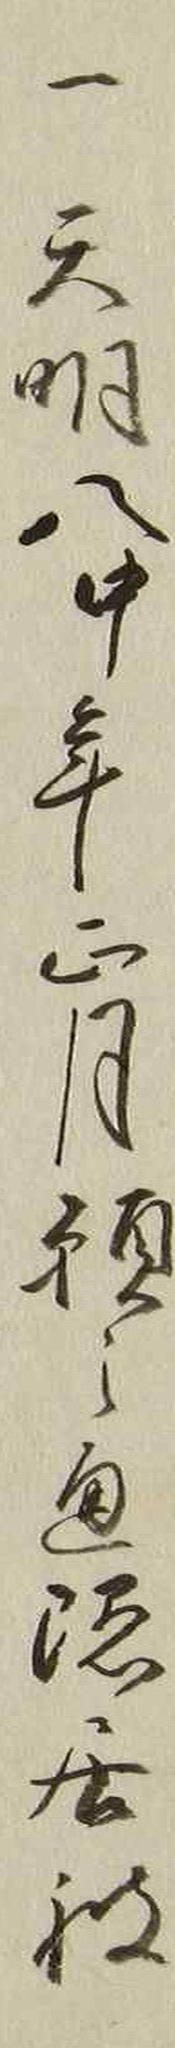一天明八申年正月願之通隠居被
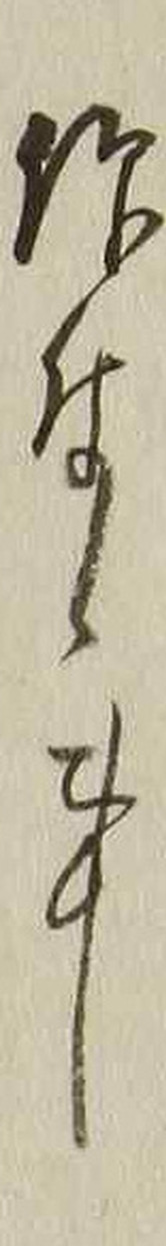仰付候事
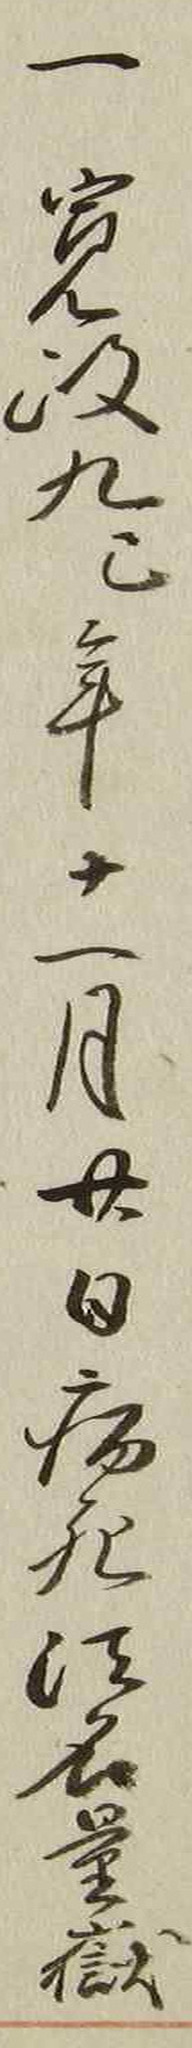一寛政九巳年十一月廿日病死法名量岳
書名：諸士系譜　巻之122　よ之部5
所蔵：会津若松市立会津図書館
